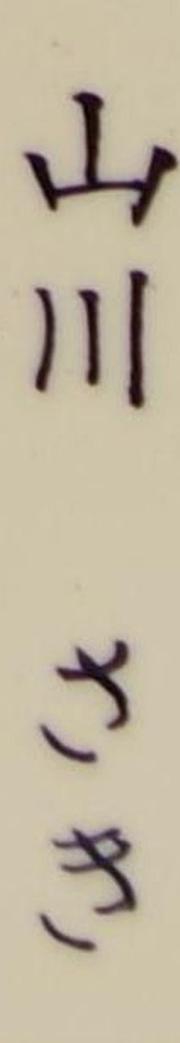山川さき
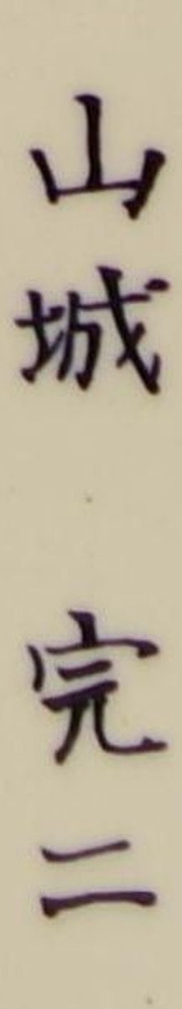山城完二
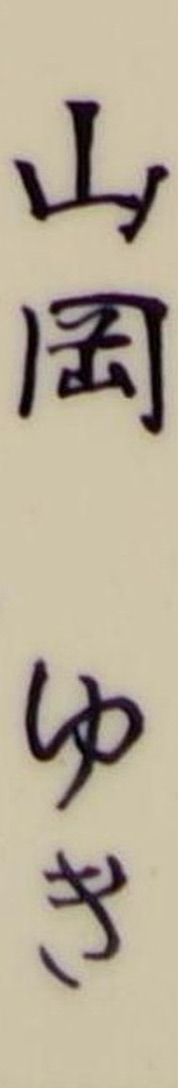山岡ゆき
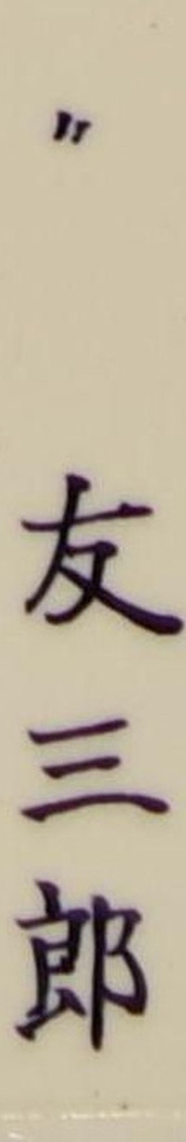友三郎
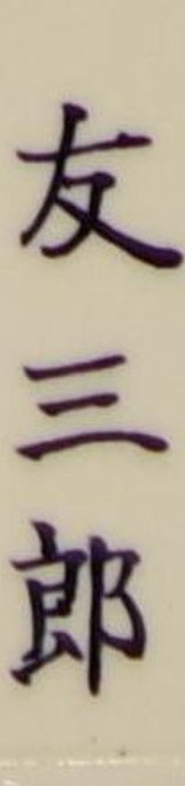友三郎
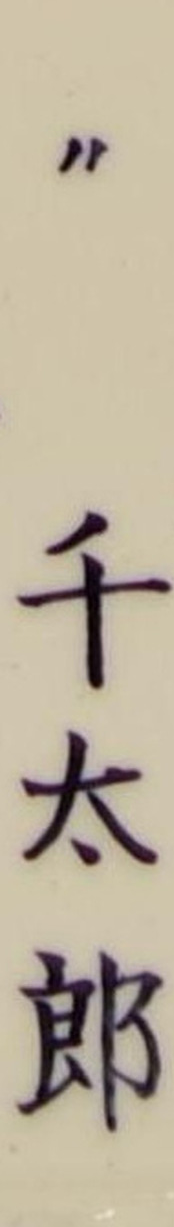千太郎
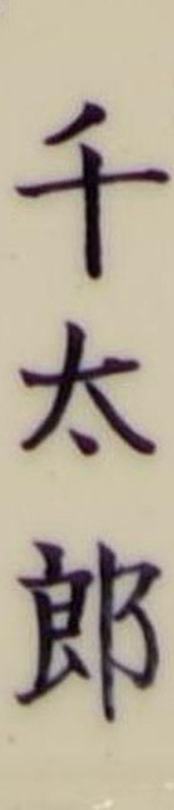千太郎
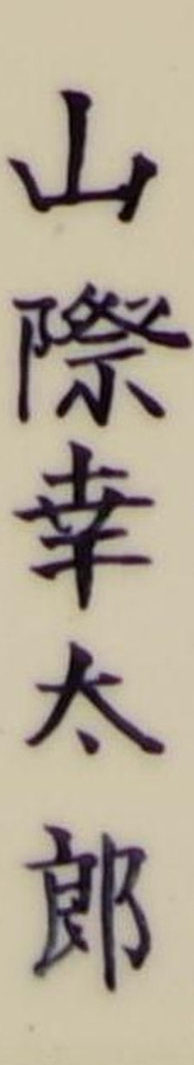山際幸太郎
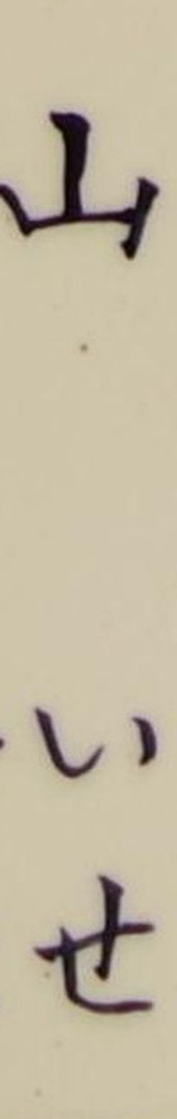山いせ
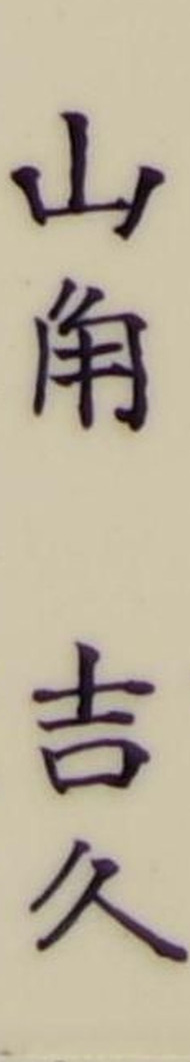山角吉久
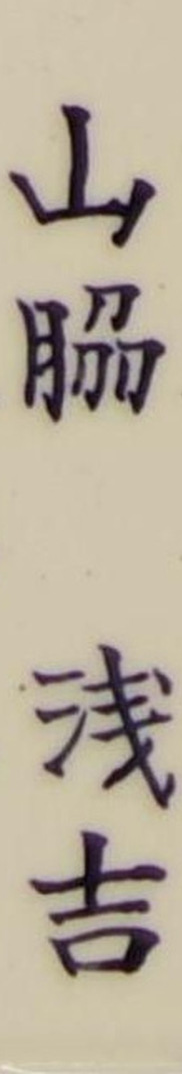山脇浅吉
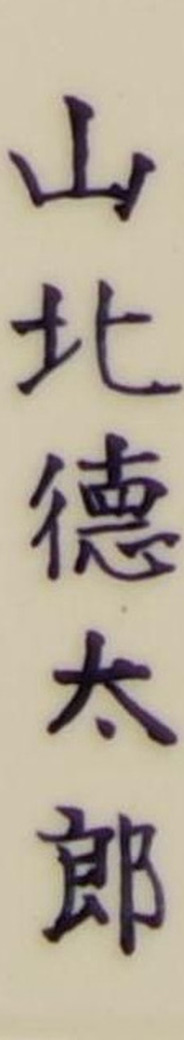山北徳太郎
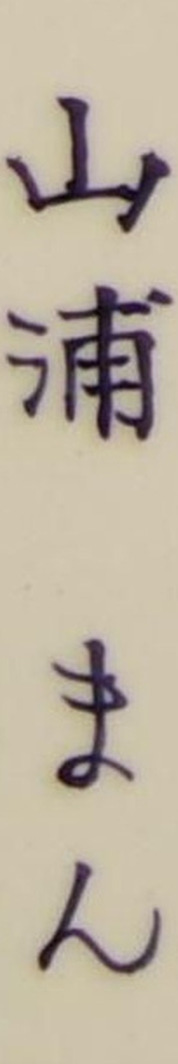山浦まん
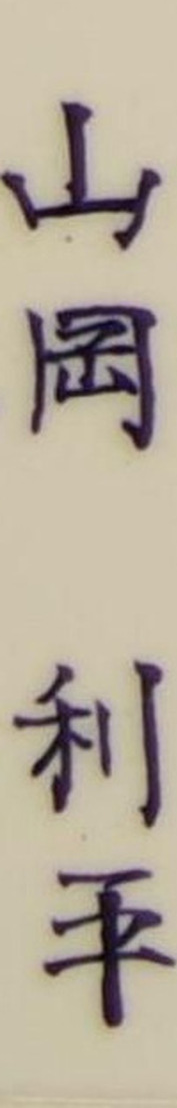山岡利平
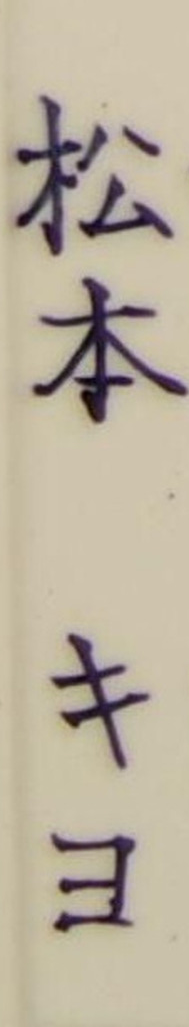松本キヨ

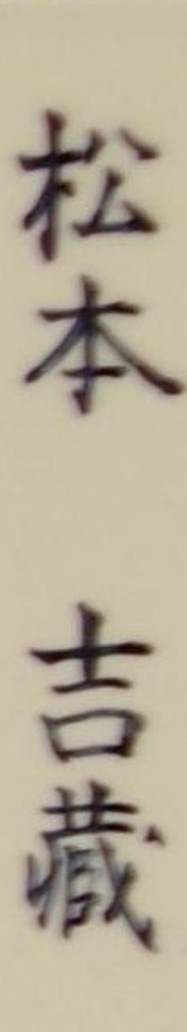松本吉蔵
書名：A~D
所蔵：koyasan kongobuji
